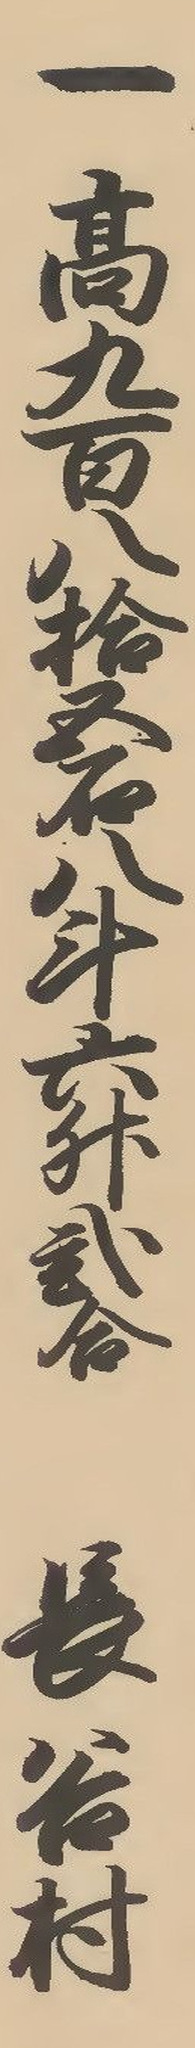一高九百八拾五石八斗六升弐合長谷村
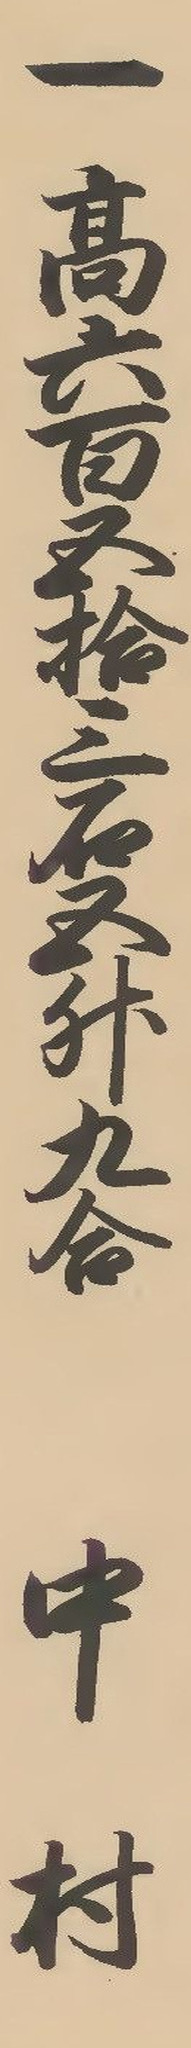一高六百五拾三石五升九合中村

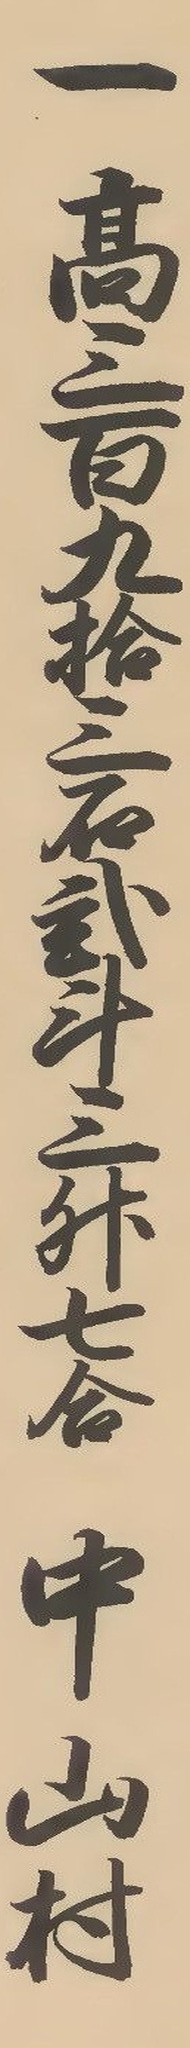一高三百九拾三石弐斗三升七合中山村
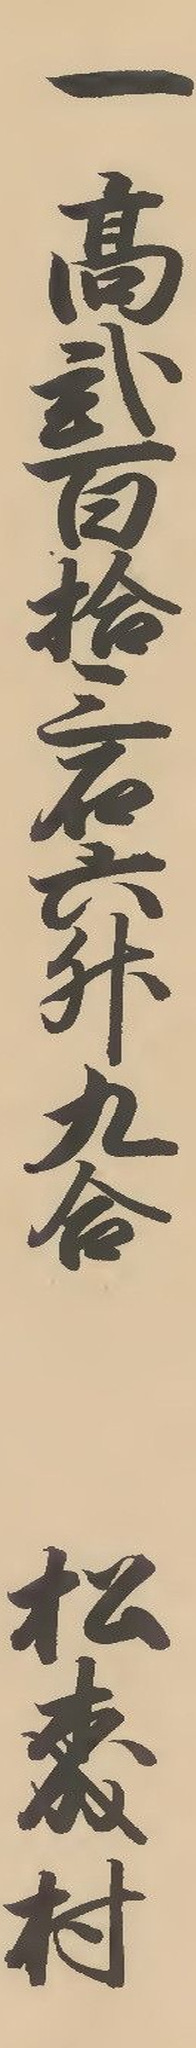一高弐百拾三石六升九合松森村
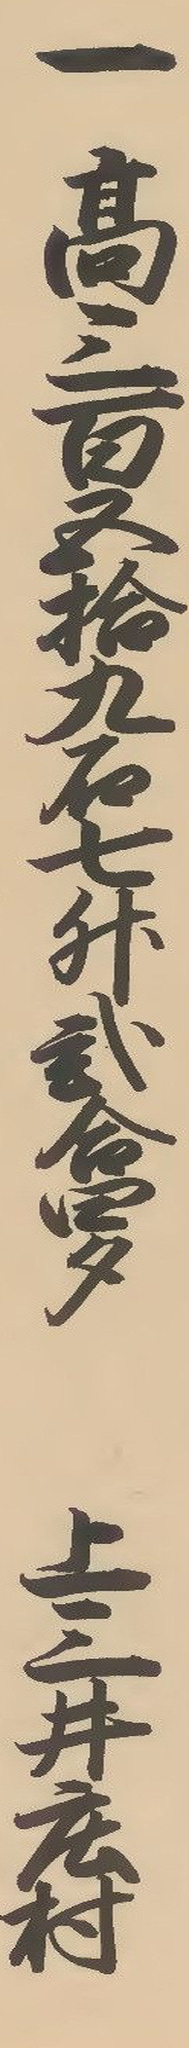一高三百五拾九石七升弐合四勺上三井庄村
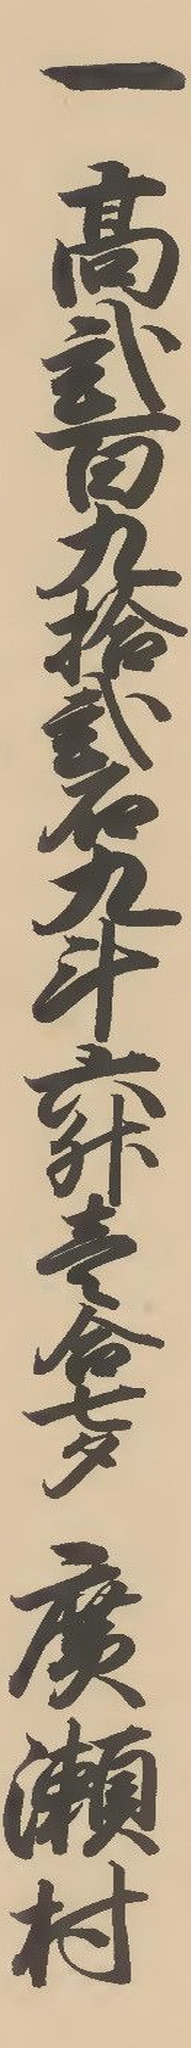一高弐百九拾弐石九斗六升壱合七勺広瀬村
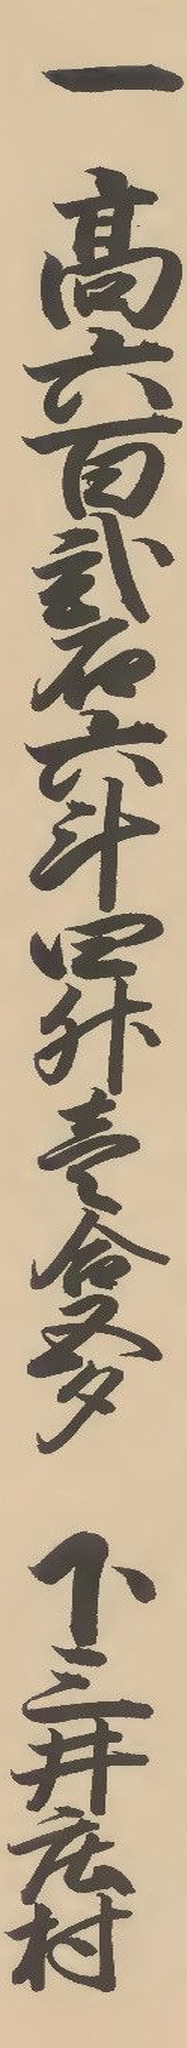一高六百弐石六斗四升壱合五勺下三井庄村
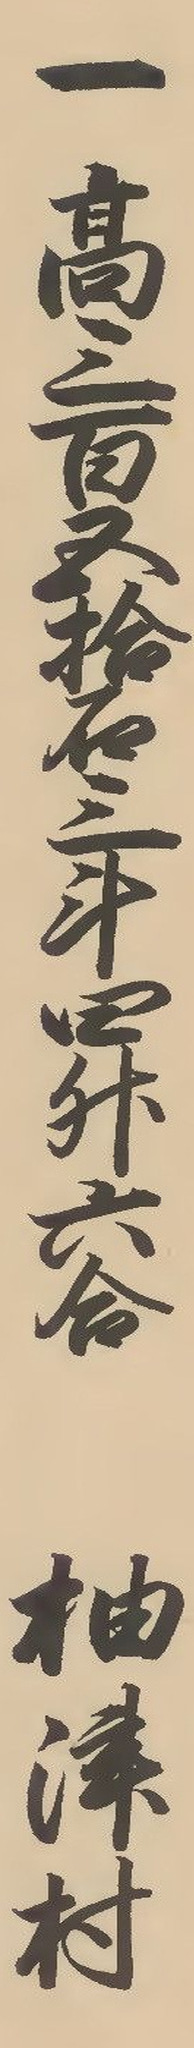一高三百五拾石三斗四升六合柚津村
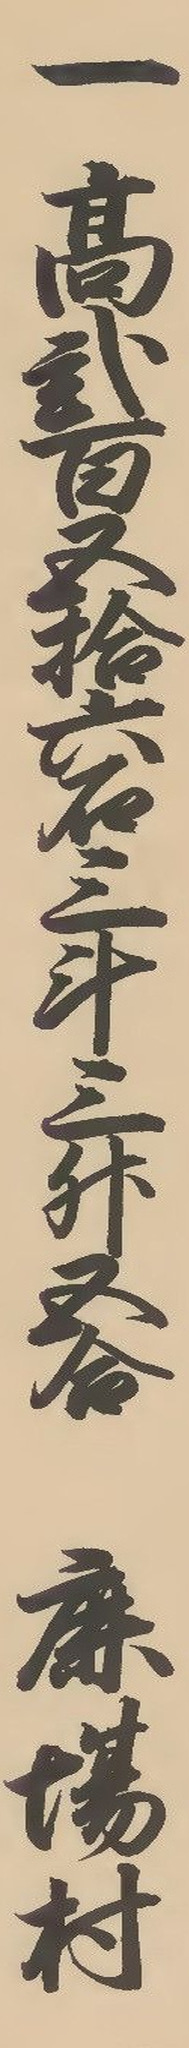一高弐百五拾六石三斗三升五合鹿場村

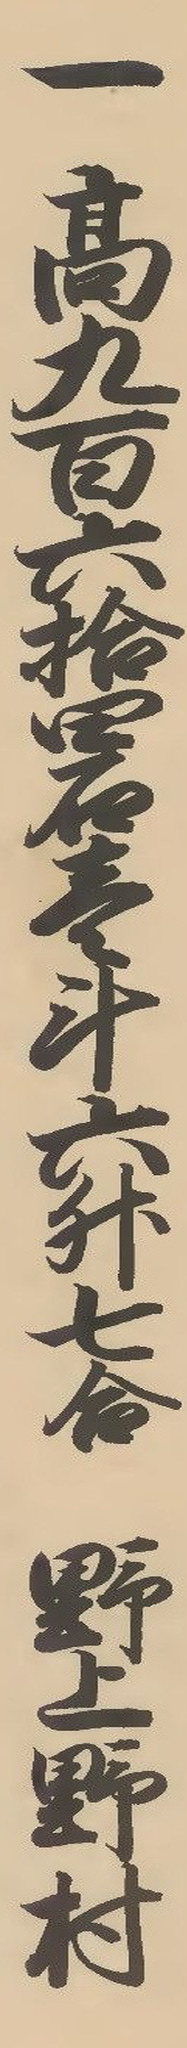一高九百六拾四石壱斗六升七合野上野村
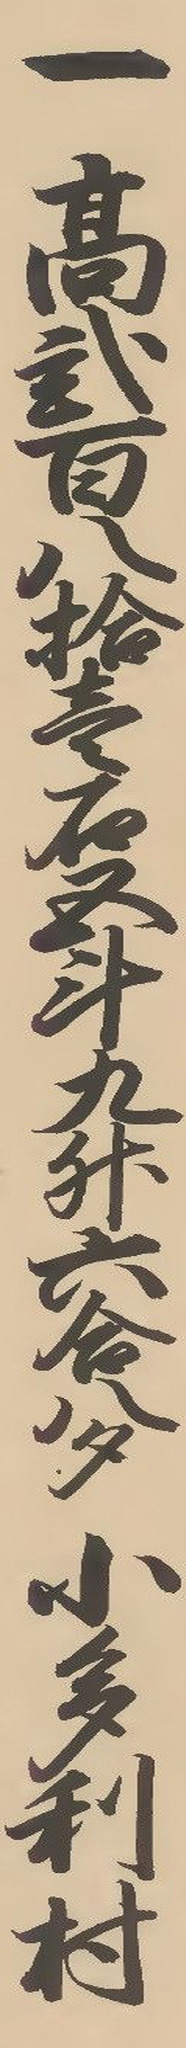一高弐百八拾壱石五斗九升六合八勺小多利村
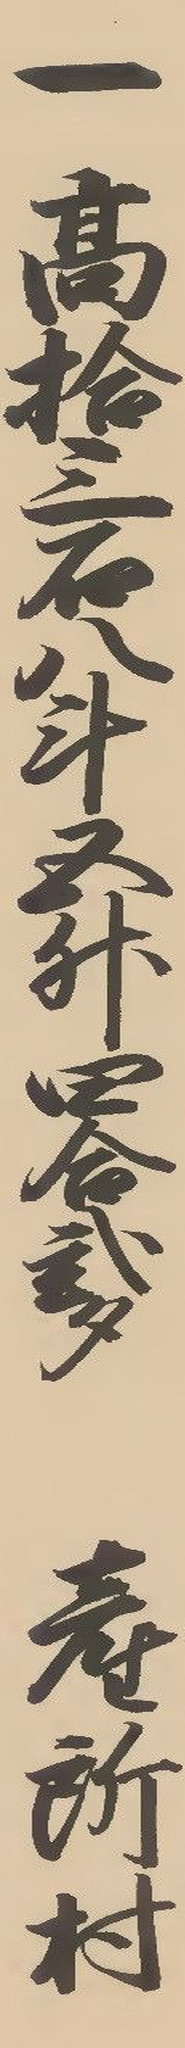一高拾三石八斗五升四合弐勺産所村
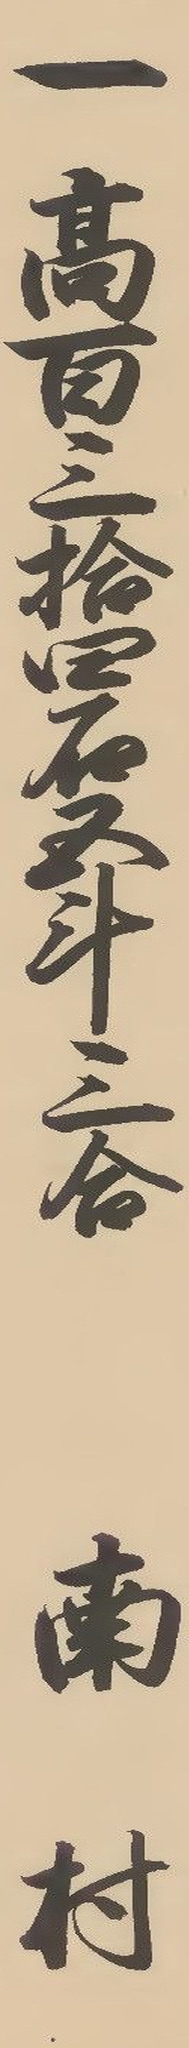一高百三拾四石五斗三合南村
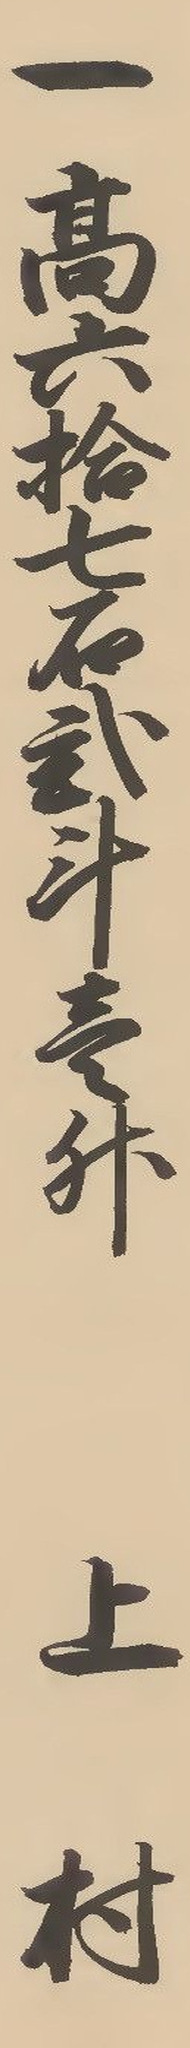一高六拾七石弐斗壱升上村
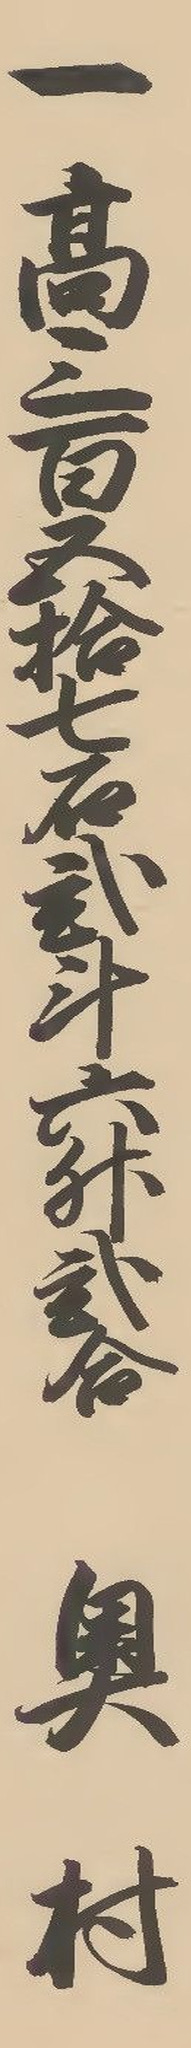一高三百五拾七石弐斗六升弐合奥村

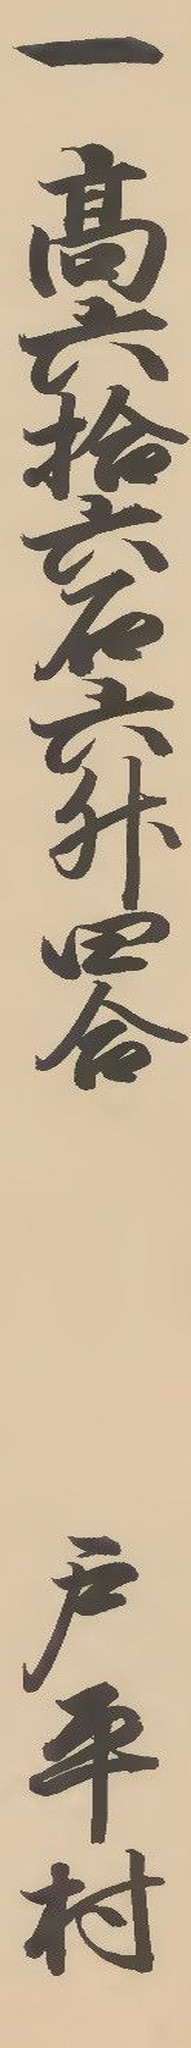一高六拾六石六升四合戸平村
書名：丹波国郷帳
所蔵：国立公文書館 National Archives of Japan
